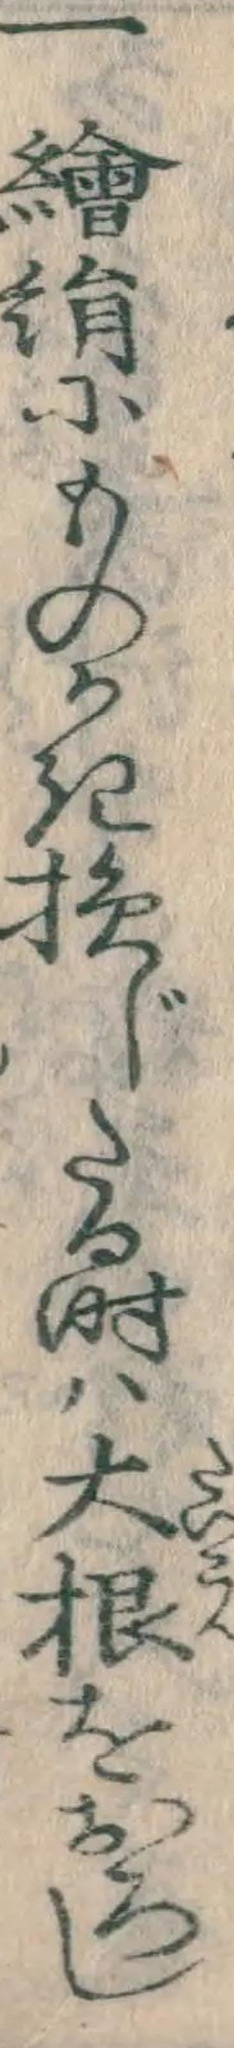一絵絹にものかき損じたる時は大根をおろし
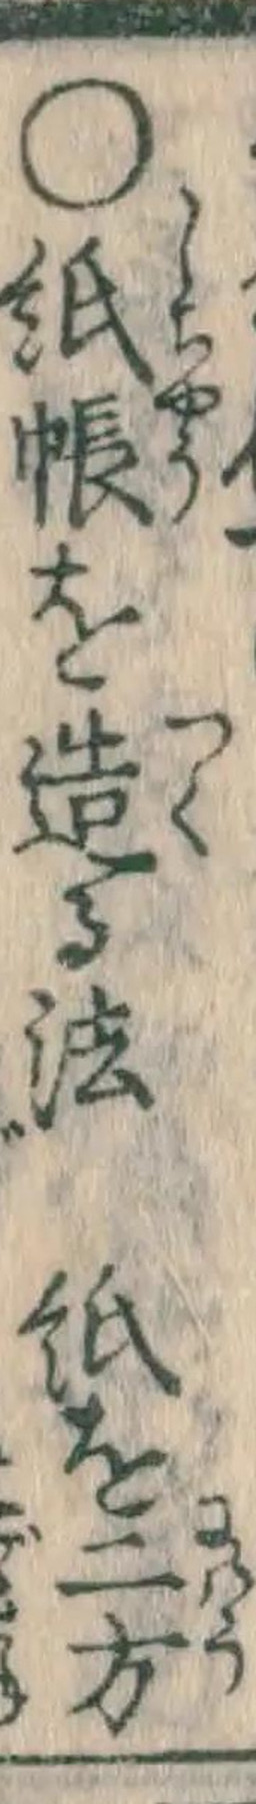○紙帳を造る法紙を二方
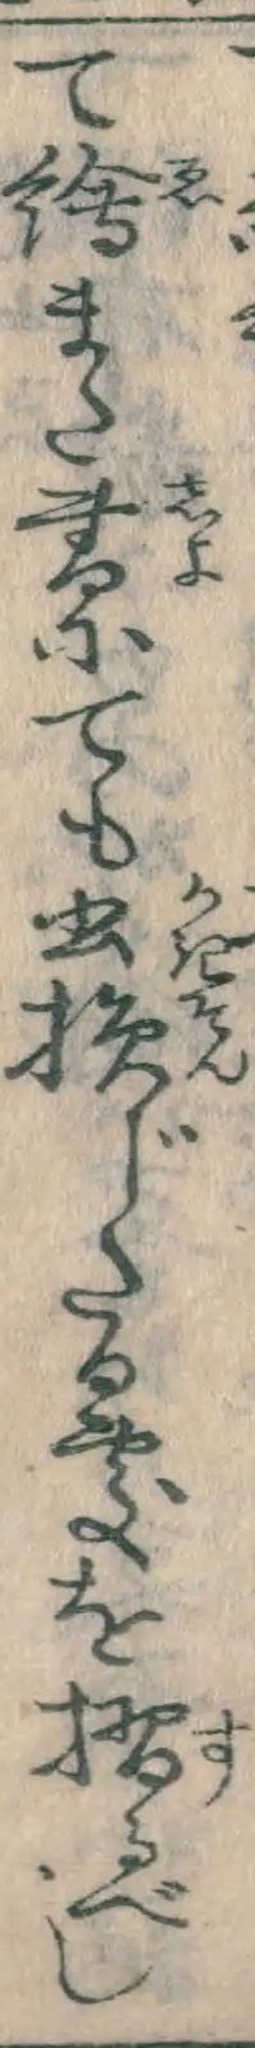て絵また書にても書損じたる処を摺るべし
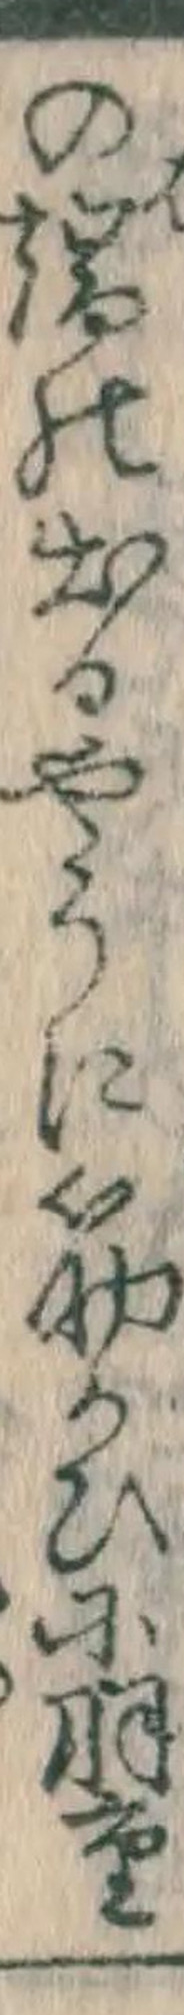の端の出るやうに筋かひに羽重
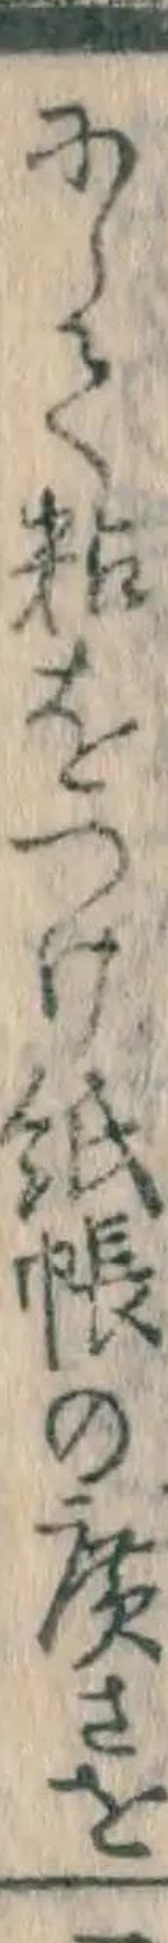にして粘をつけ紙帳の広さを
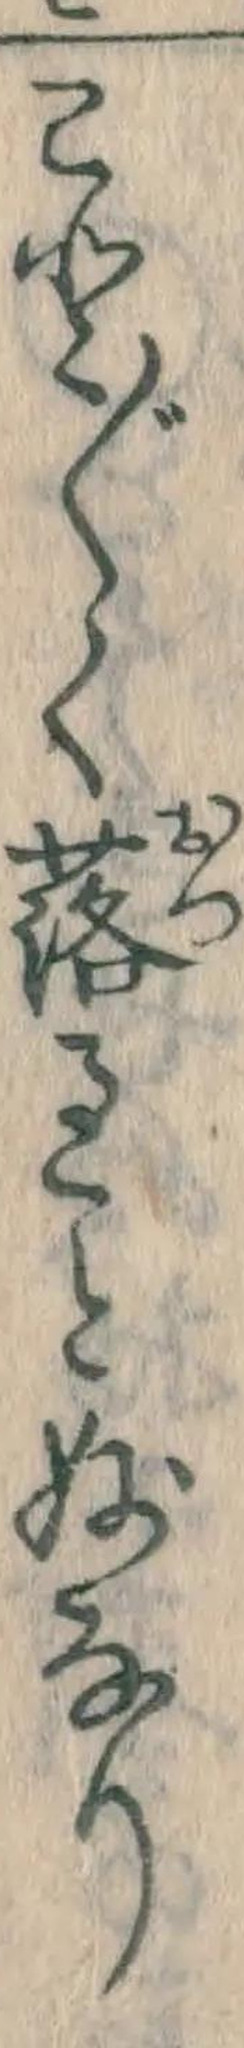こと〴〵く落ること妙なり

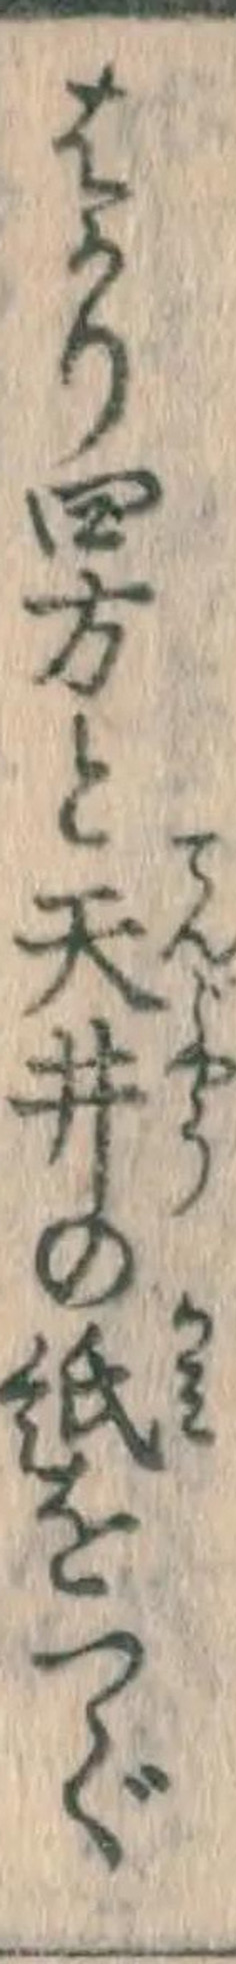はかり四方と天井の紙をつぐ
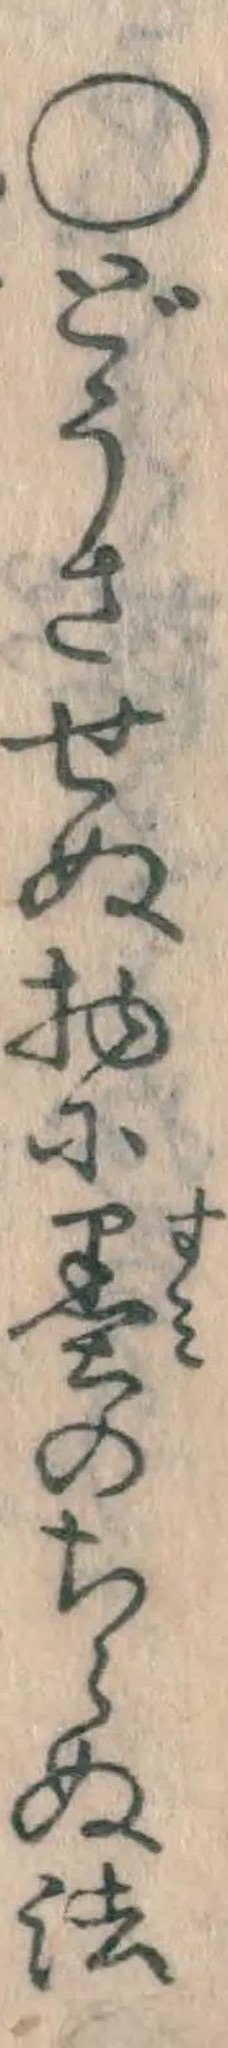○どうさせぬ物に墨のちらぬ法
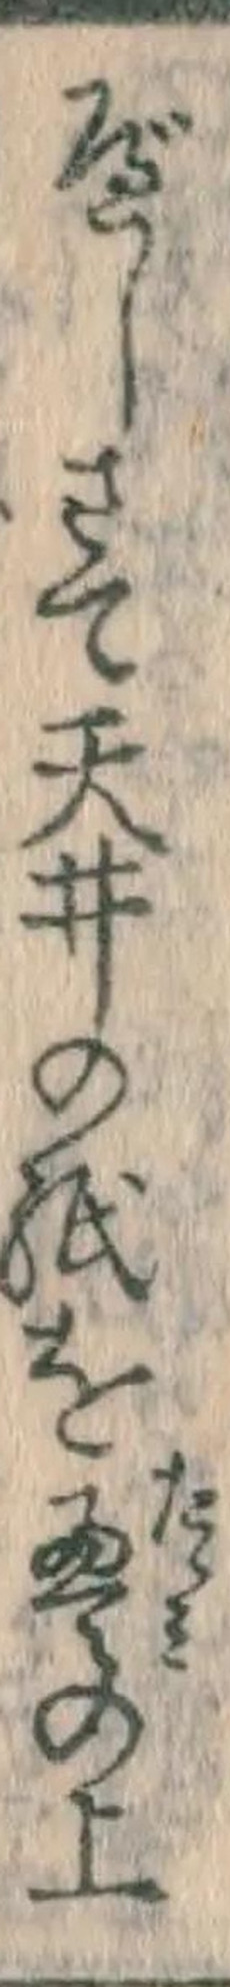べしさて天井の紙を畳の上
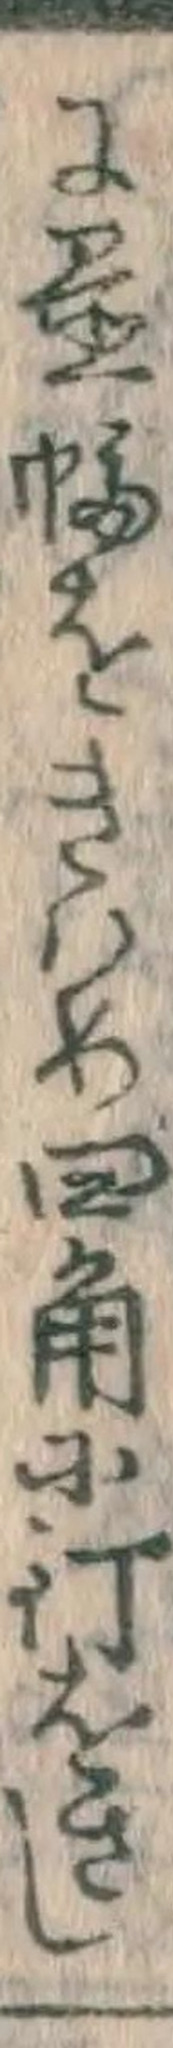に置幅をきはめ四角に釘をさし
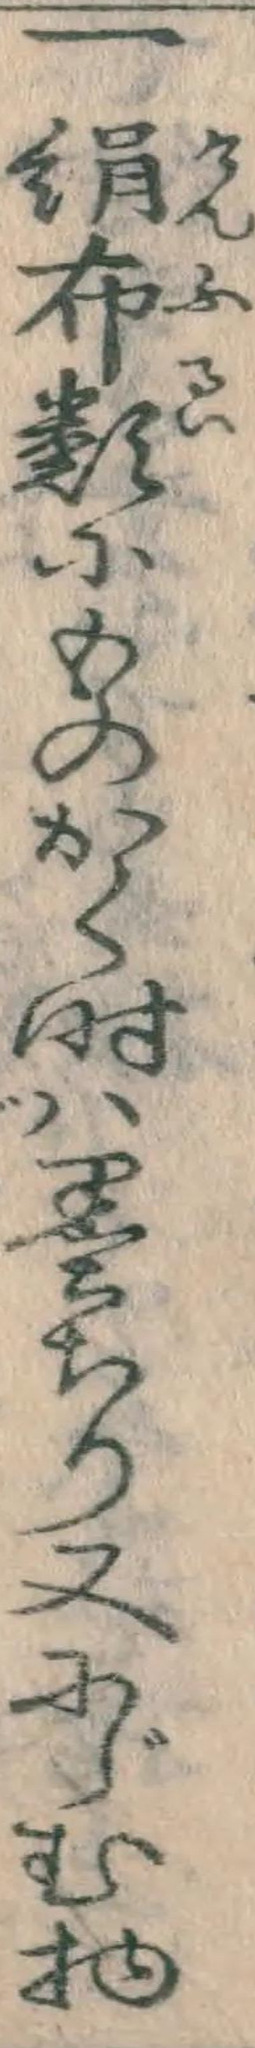一絹布類にものかく時は墨ちり又はにじむ物
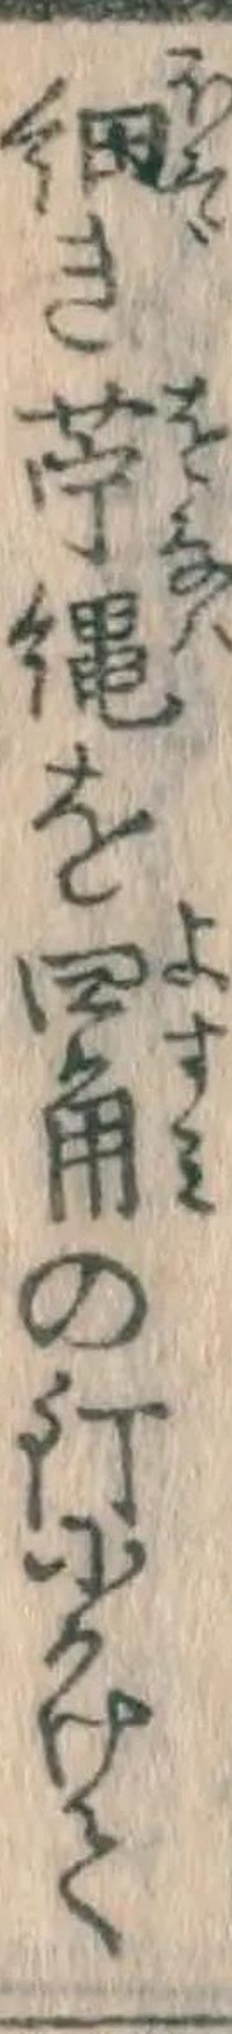細き苧縄を四角の釘にかけて
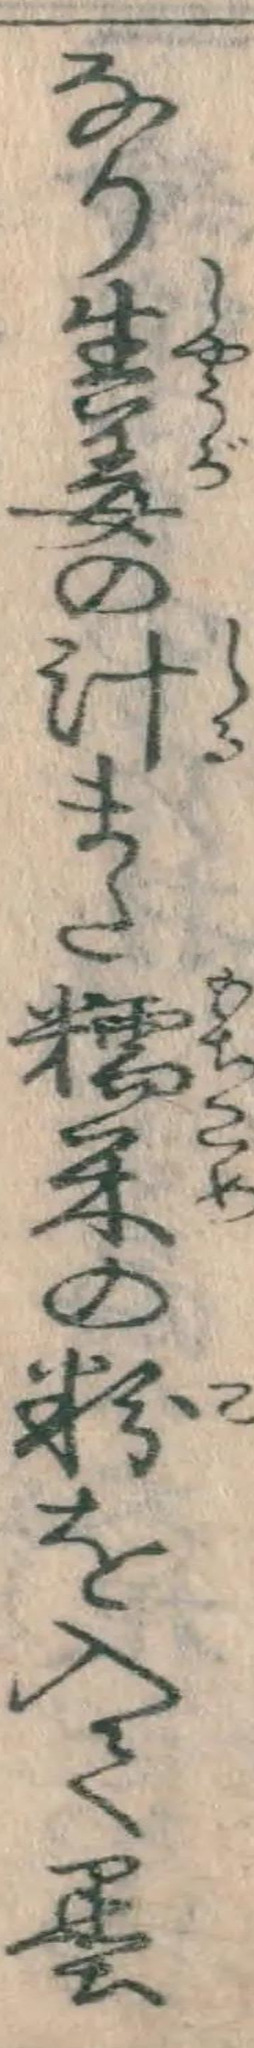なり生姜の汁また糯米の粉を入て墨
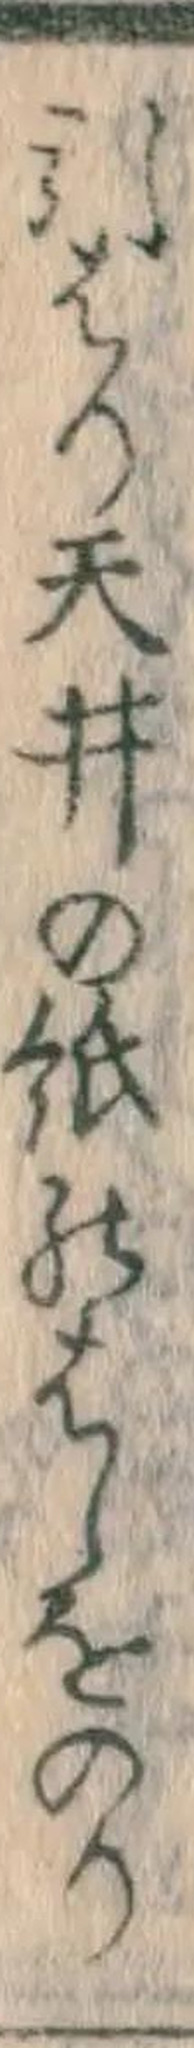引はり天井の紙のはしをのり
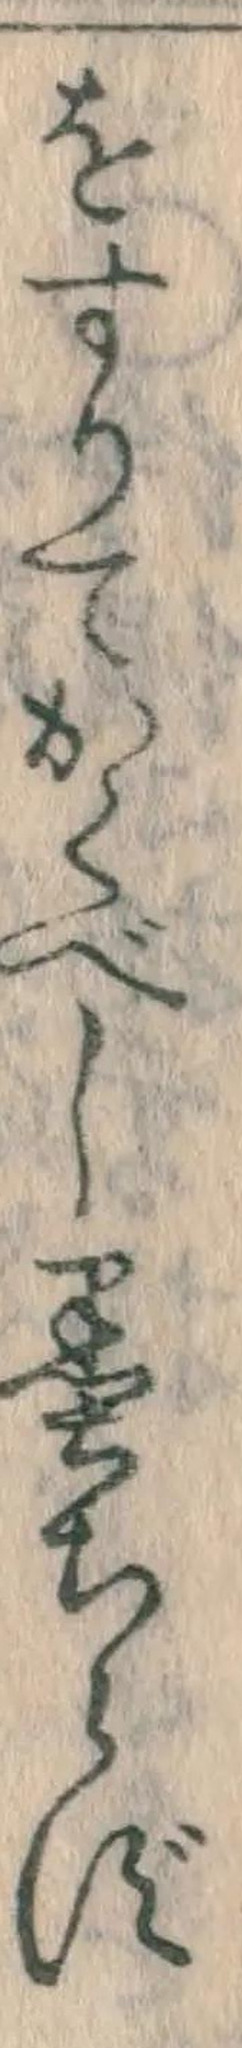をすりてかくべし墨ちらず
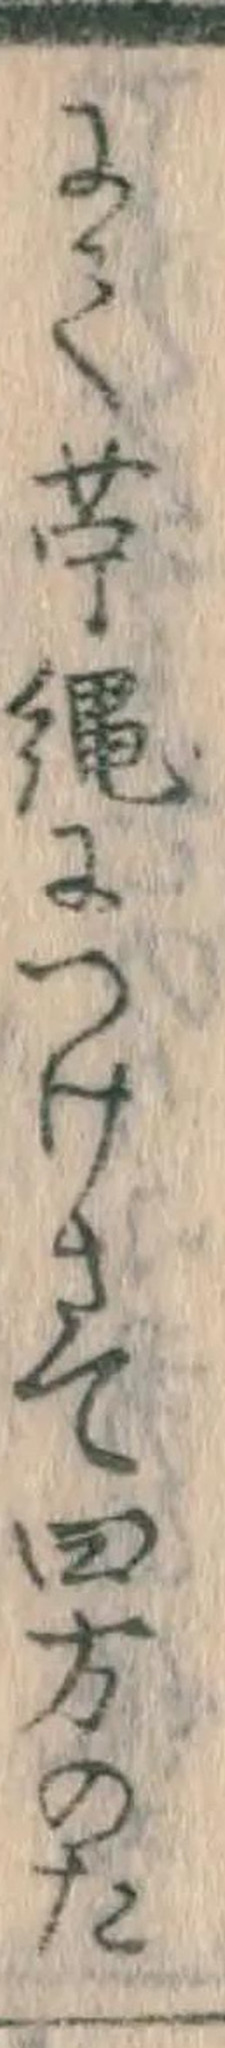にて苧縄につけさて四方のた
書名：広益秘事大全 3巻. [2]
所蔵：国立国会図書館 National Diet Library, JAPAN
